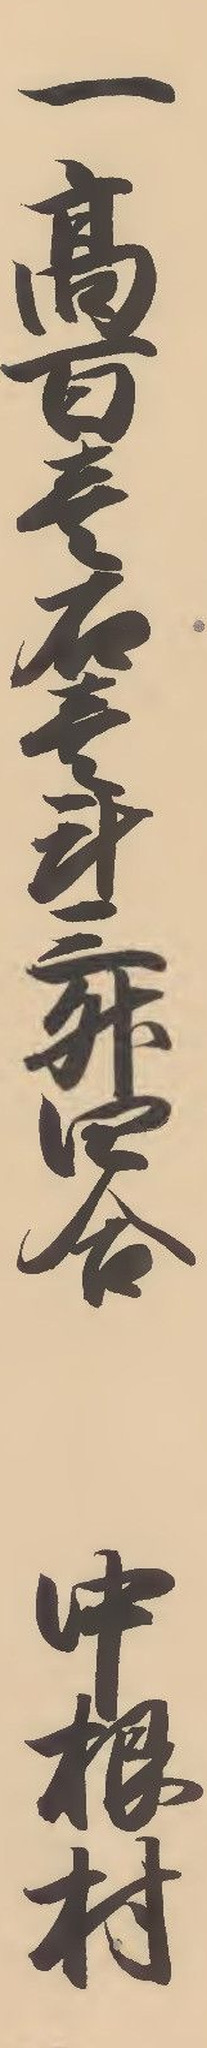一高百壱石壱斗三升四合中根村
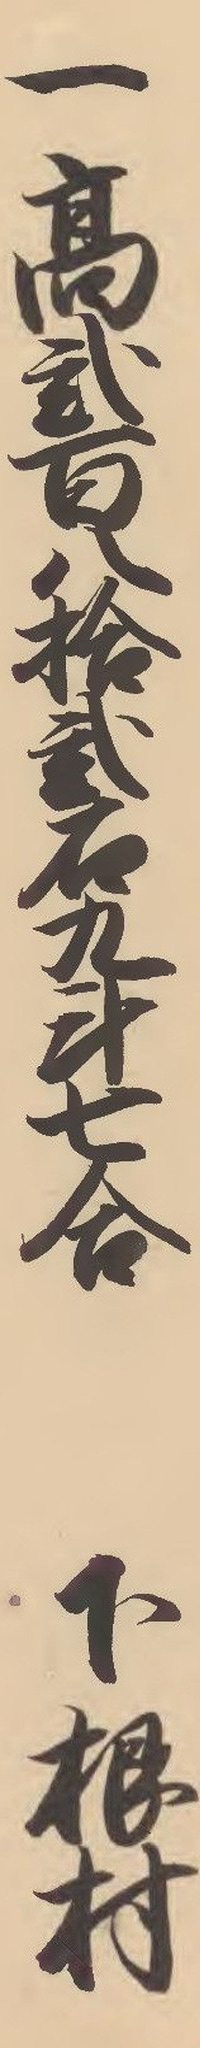一高弐百八拾弐石九斗七合下根村

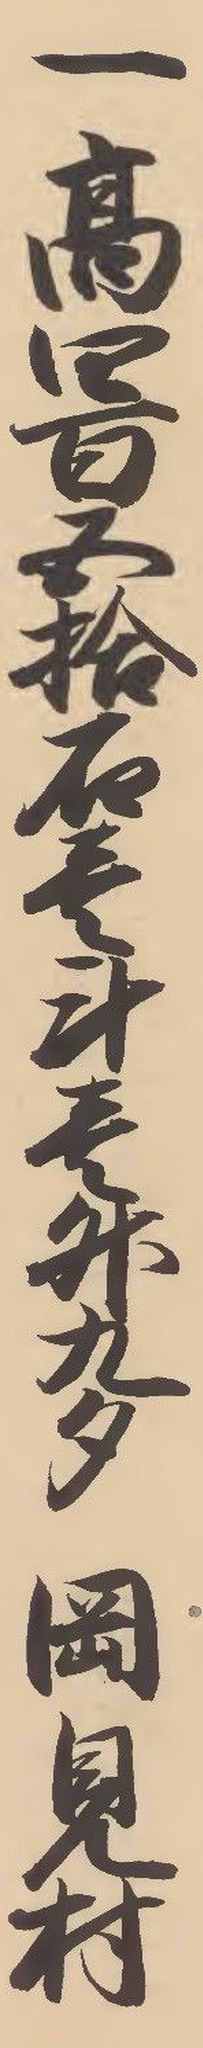一高四百五拾石壱斗壱升九勺岡見村
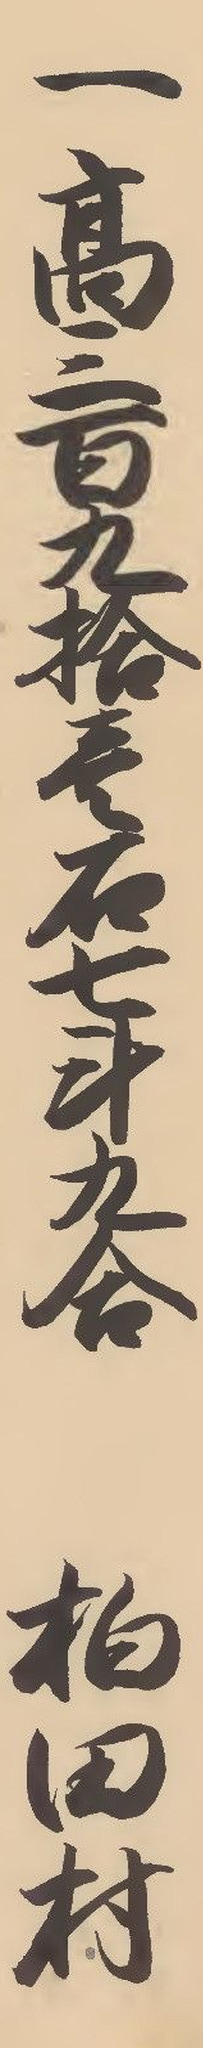一高三百九拾壱石七斗九合柏田村
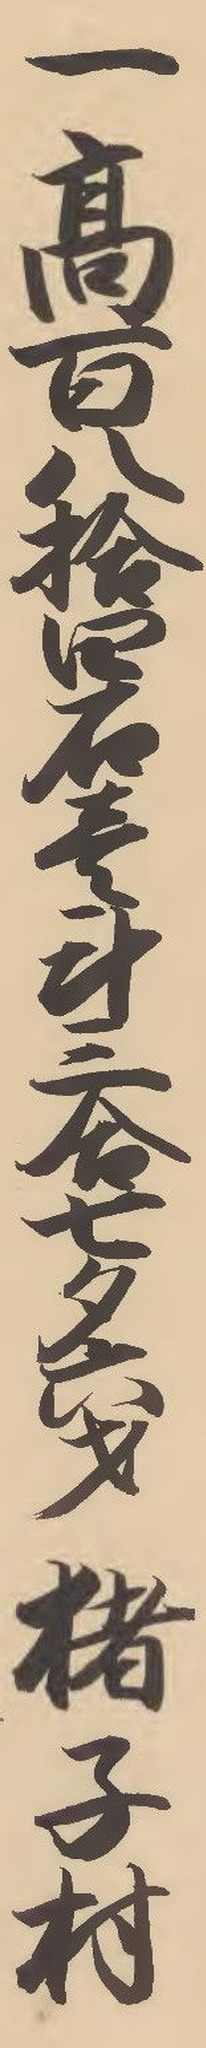一高百八拾四石壱斗三合七勺六才猪子村
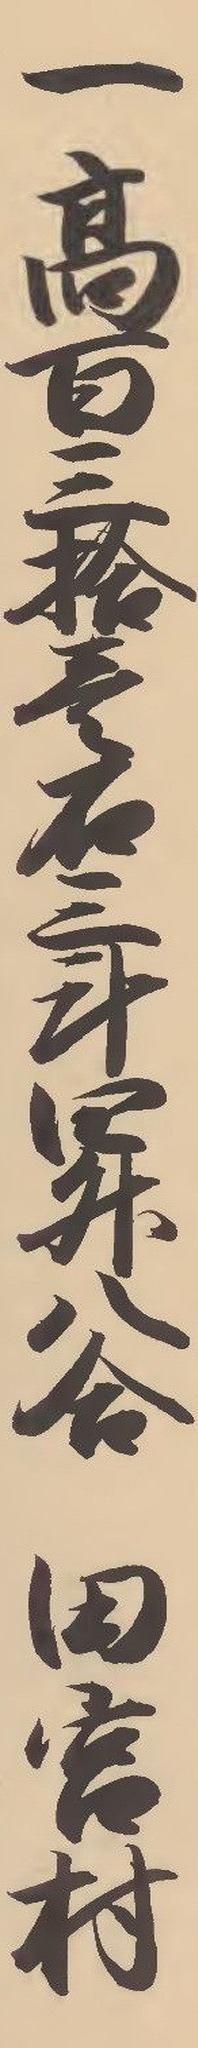一高百三拾壱石三斗四升八合田宮村
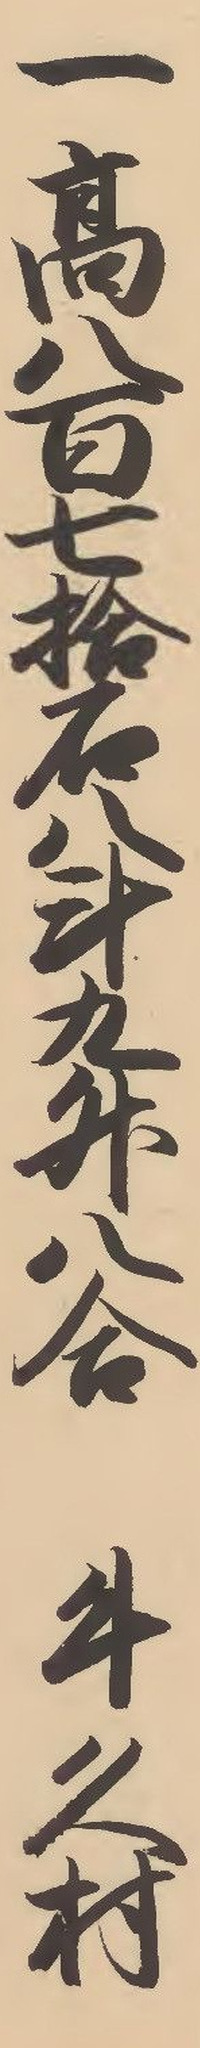一高八百七拾石八斗九升八合牛久村
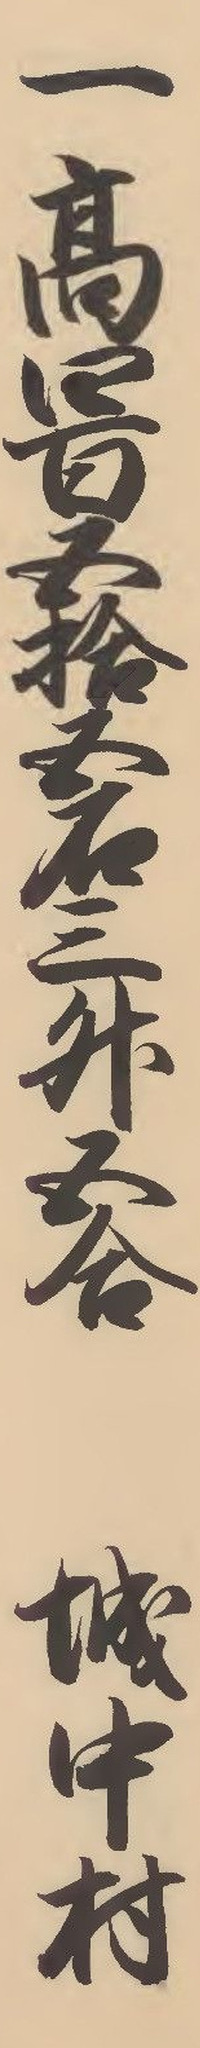一高四百五拾五石三升五合城中村
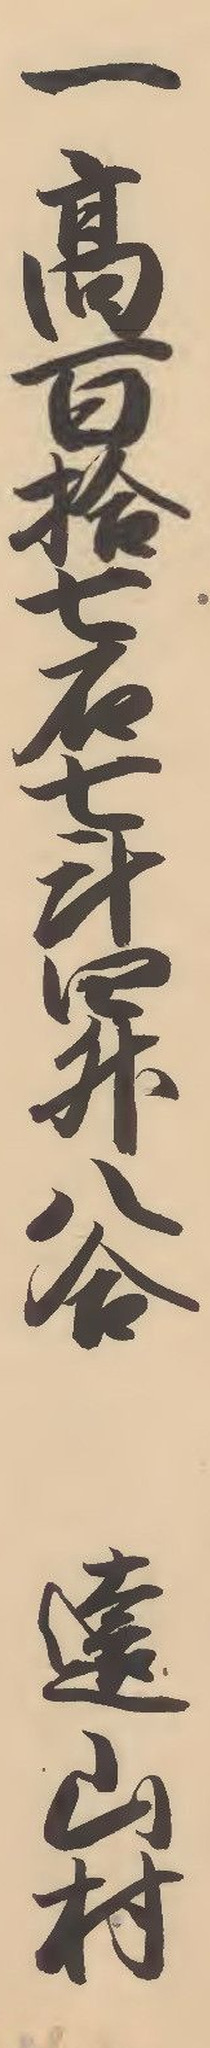一高百拾七石七斗四升八合遠山村
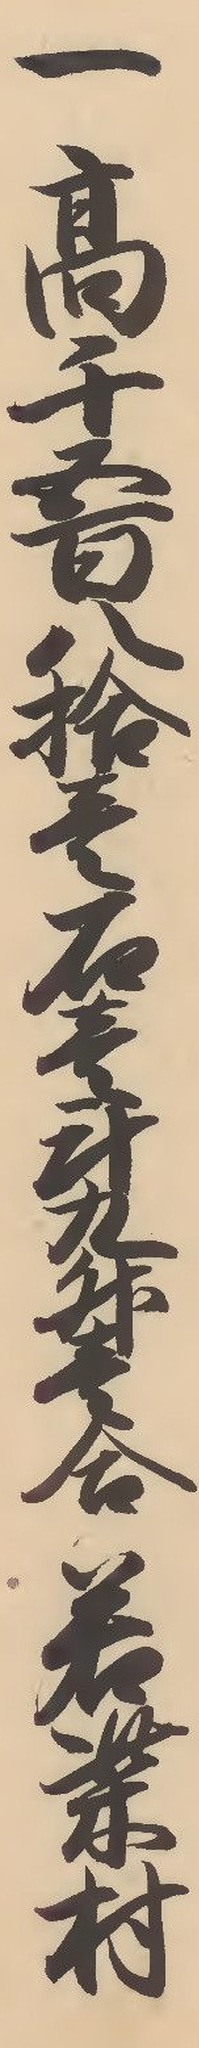一高千五百八拾壱石壱斗九升壱合若柴村

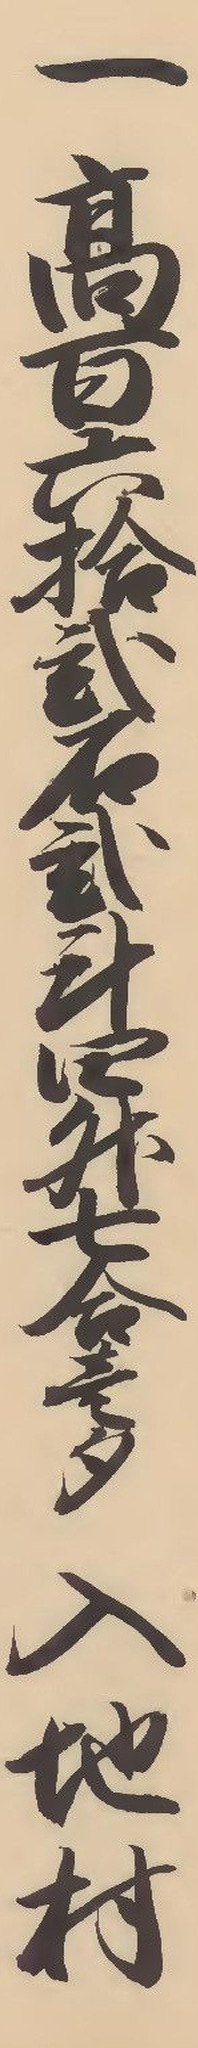一高百六拾弐石弐斗四升七合壱勺入地村
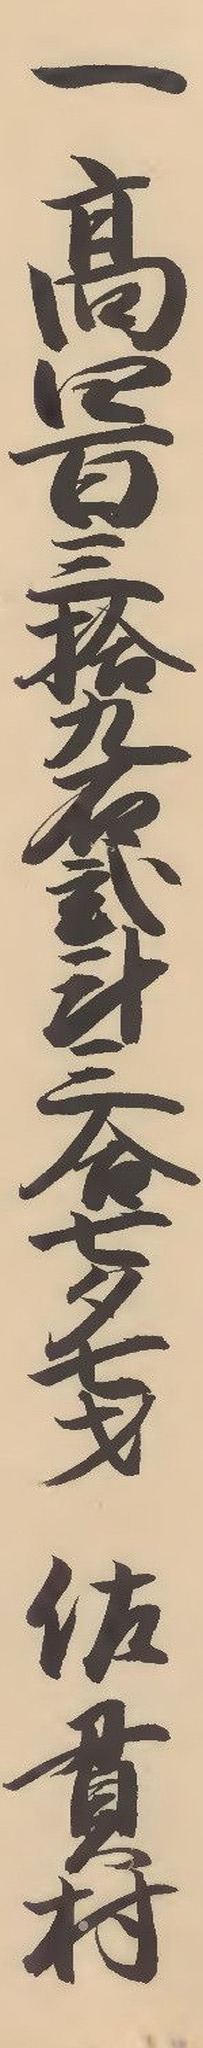一高四百三拾九石弐斗三合七勺七才佐貫村
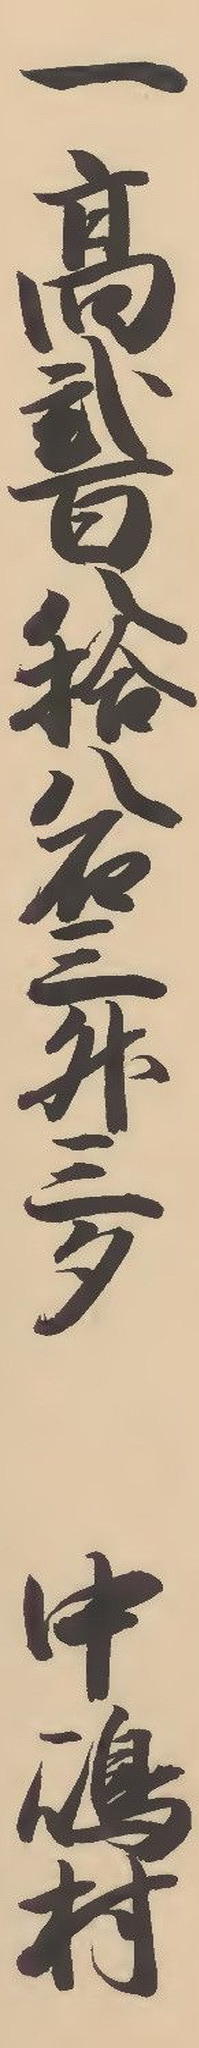一高弐百八拾八石三升三勺中島村
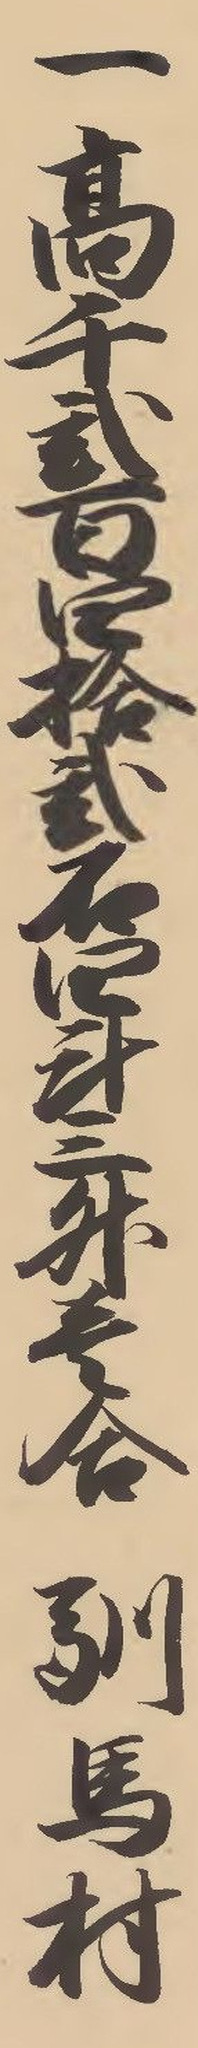一高千弐百四拾弐石四斗三升壱合馴馬村
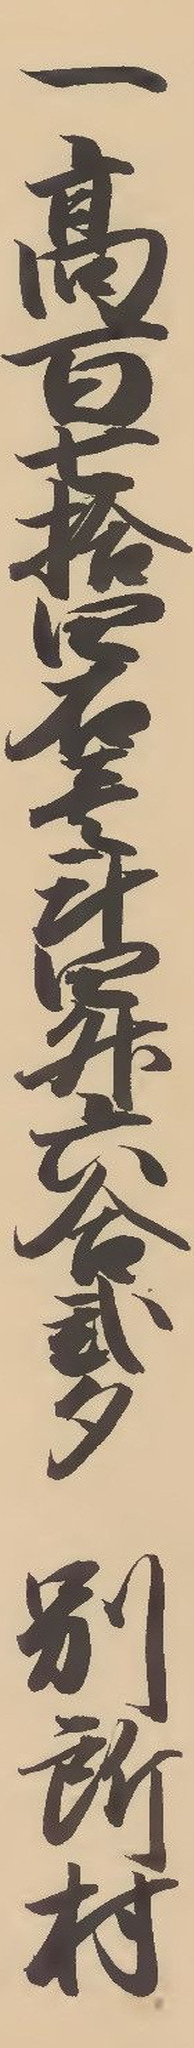一高百七拾四石壱斗四升六合弐勺別所村
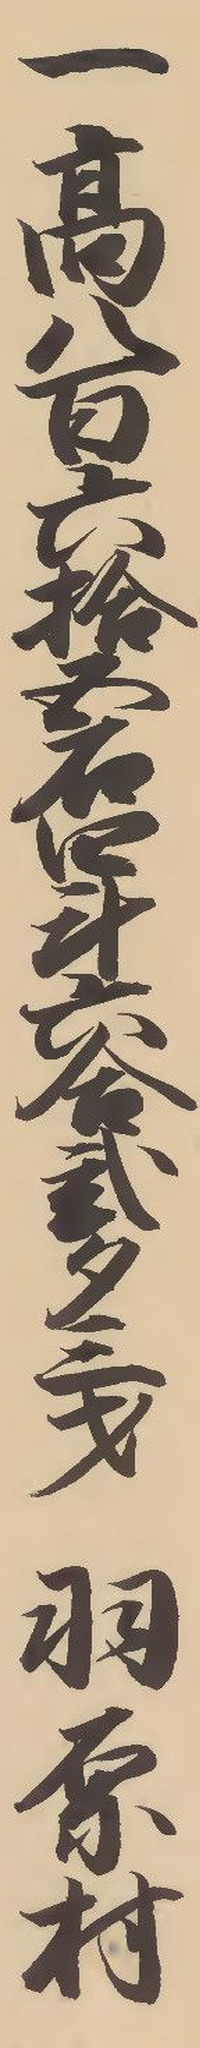一高八百六拾五石四斗六合弐勺三才羽原村
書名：常陸国郷帳
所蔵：国立公文書館 National Archives of Japan
